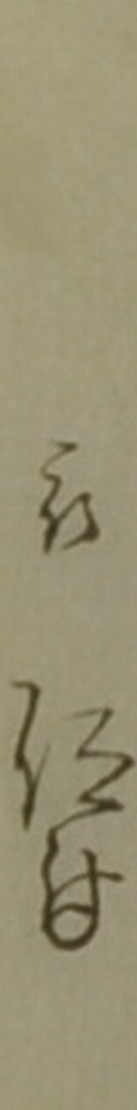被仰付
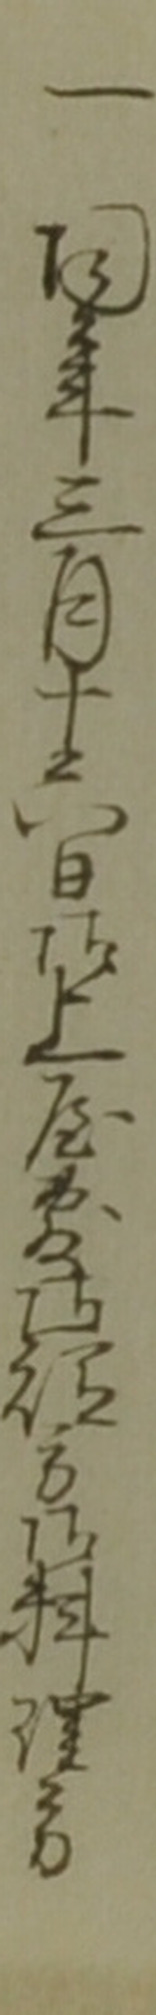一同年三月十六日御上屋敷御賄方御料理方
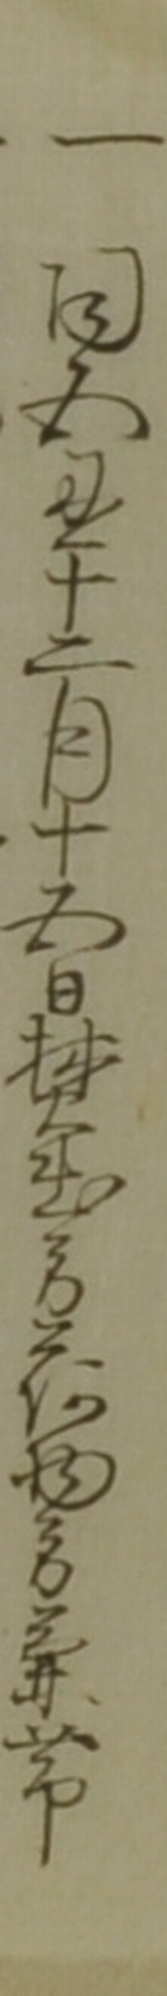一同五丑十二月十五日焚出方荷物方兼帯
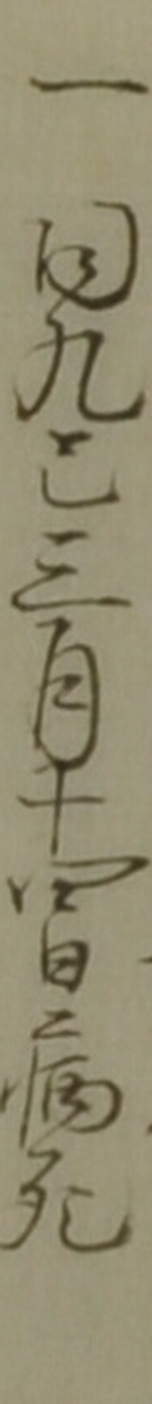一同九巳三月十四日病死
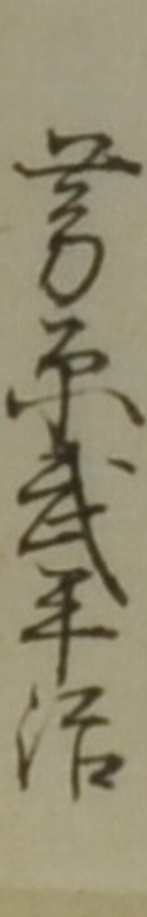芳原武平治
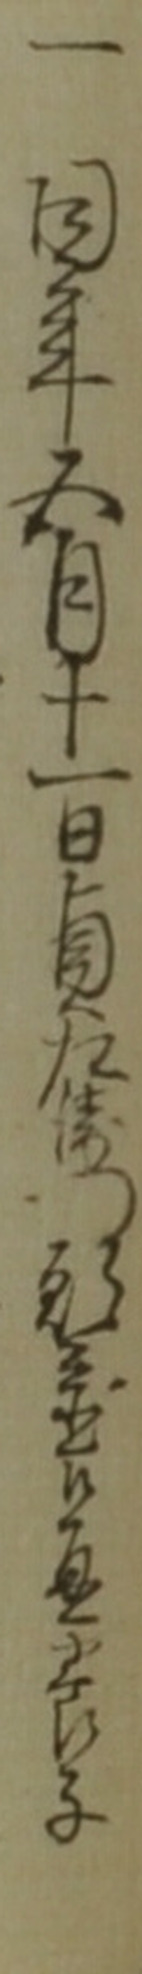一同年五月十一日貞左衛門願置候通養子
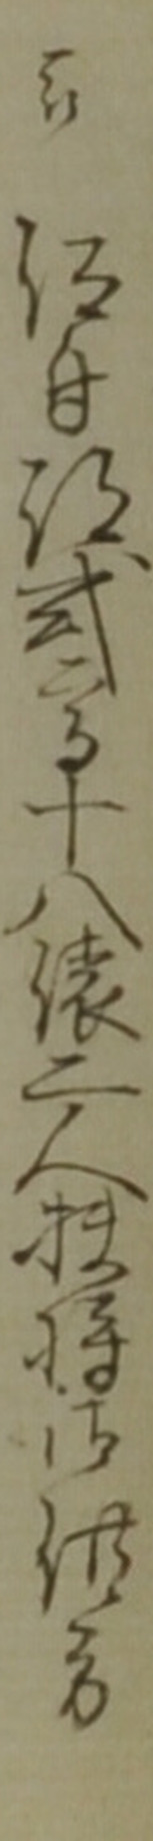被仰付跡式高十八俵二人扶持御供方
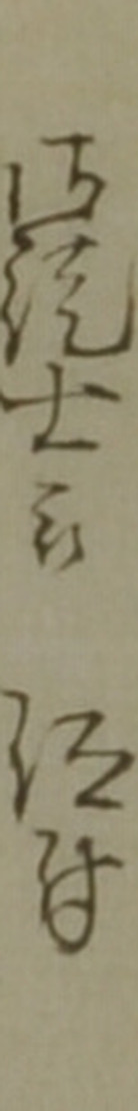御徒士被仰付
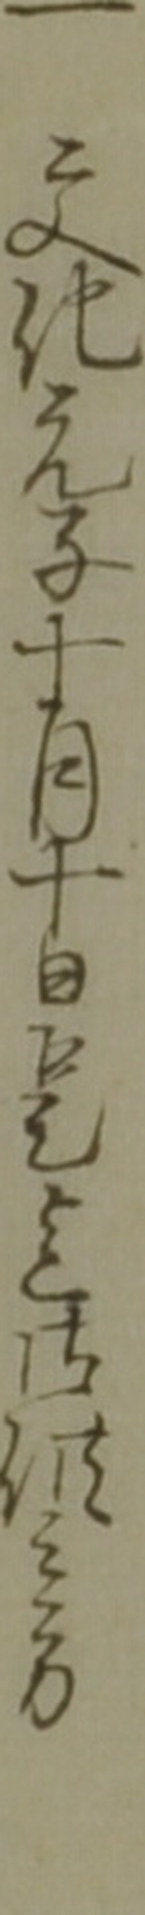一文化元子十月十日是迄御供之方
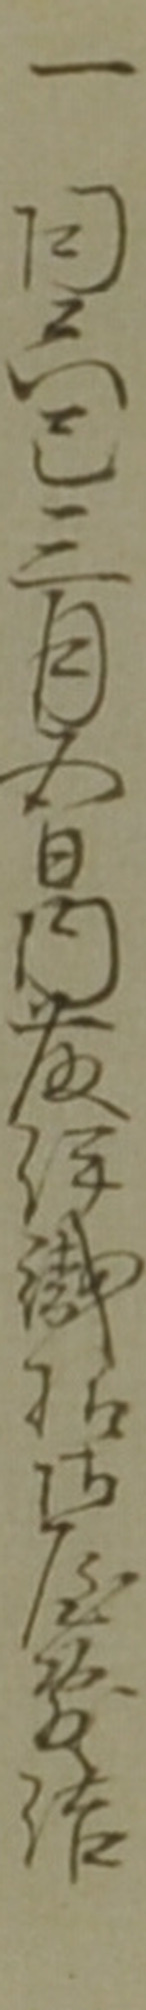一同六巳三月五日内敬伊織樣屋敷詰
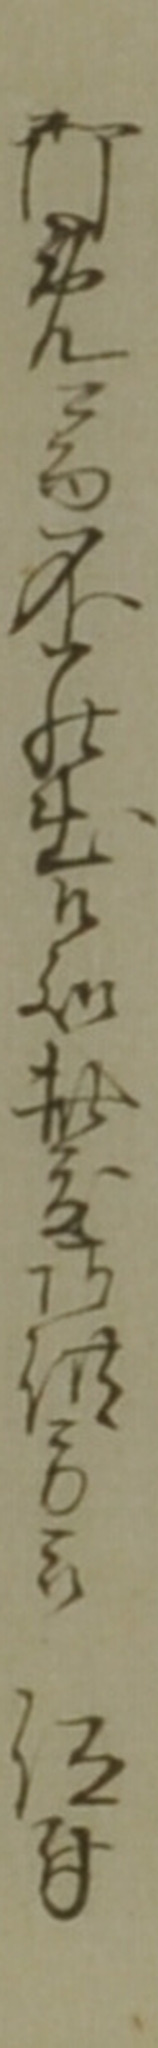御免ニ而不罷出候処此度御供方仰付
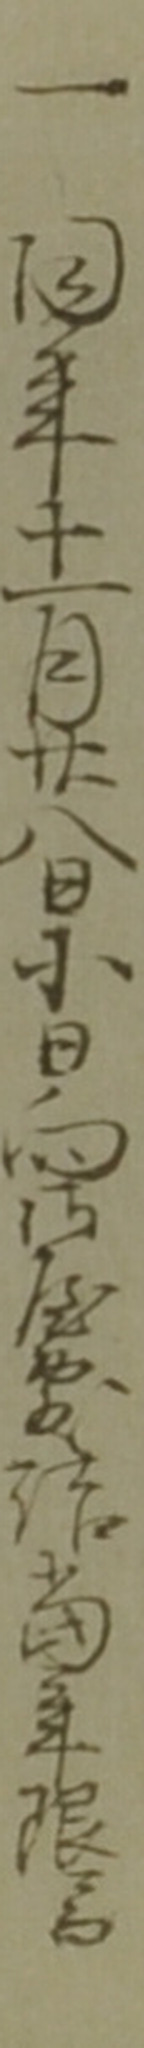一同年十一月廿八日小日向御屋敷詰当年限ニ而
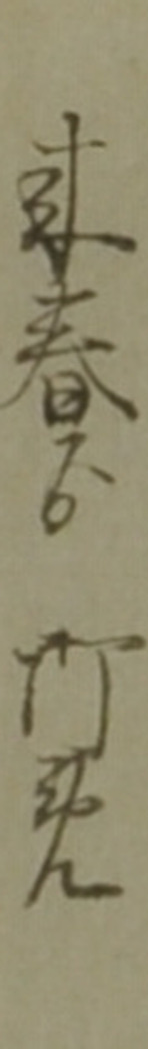来春与御免
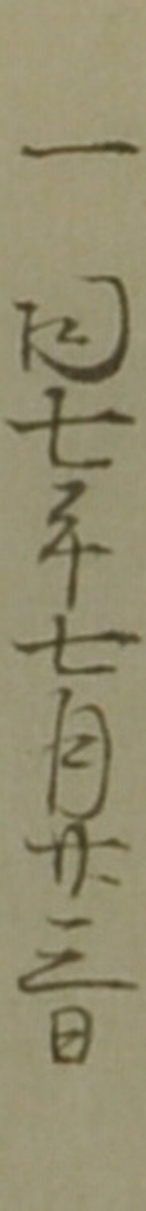一同七午七月廿三日
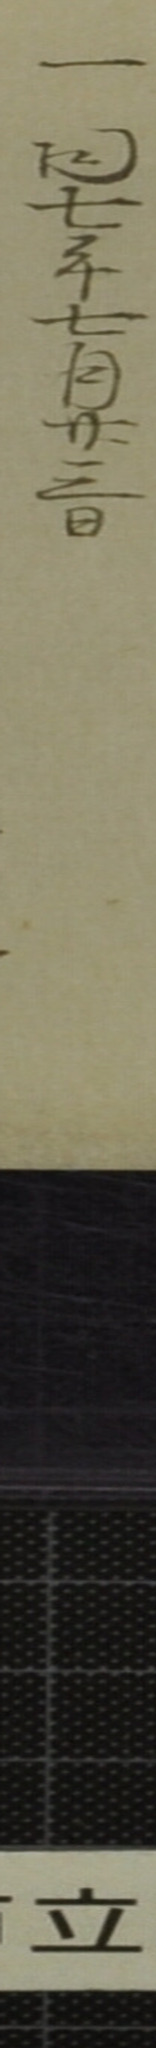一同七午七月廿三日
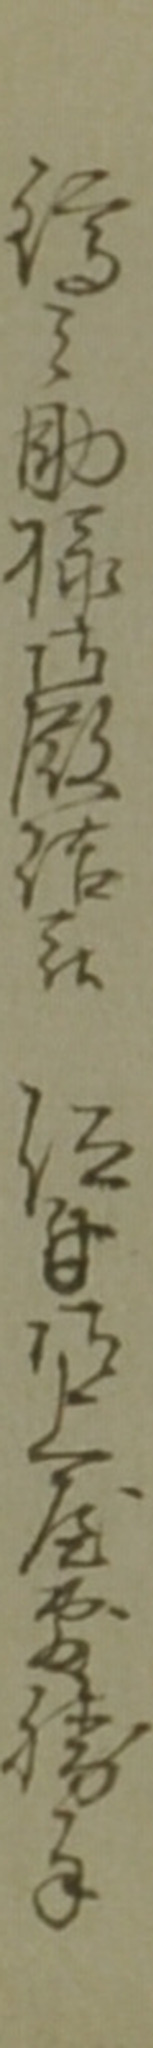縞之助様御殿詰被仰付御上屋敷勝手
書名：無足諸士勤仕録（五）
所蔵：伊那市立高遠町図書館・合同会社AMANE
